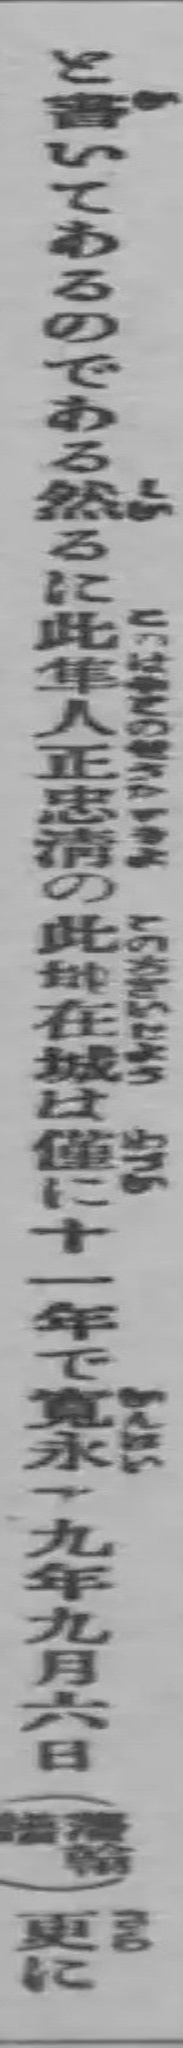と書いてあるのである然るに此隼人正忠清の此地在城は僅に十一年で寛永十九年九月六日(藩翰譜)更に

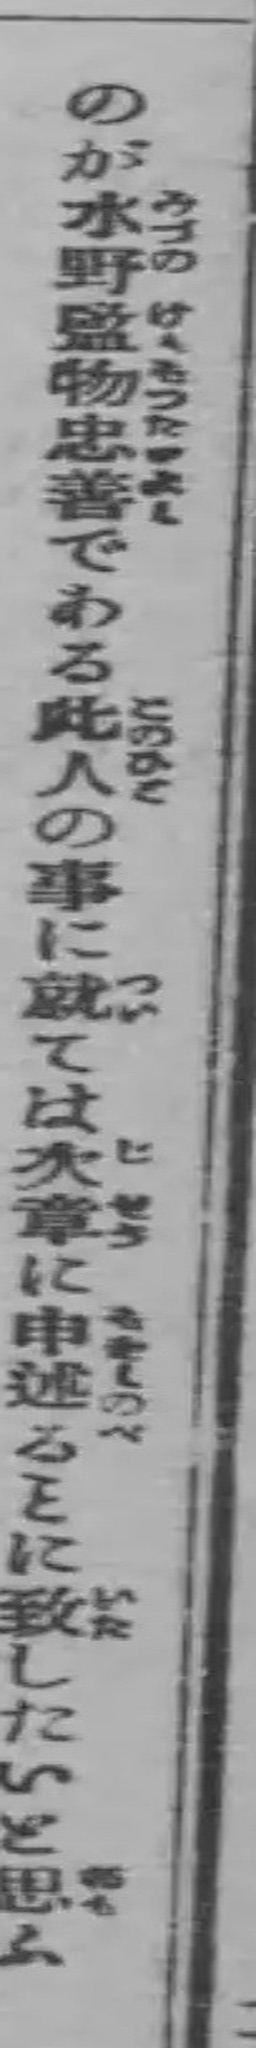のが水野監物忠善である此人の事に就ては次章に申述ることに致したいと思ふ
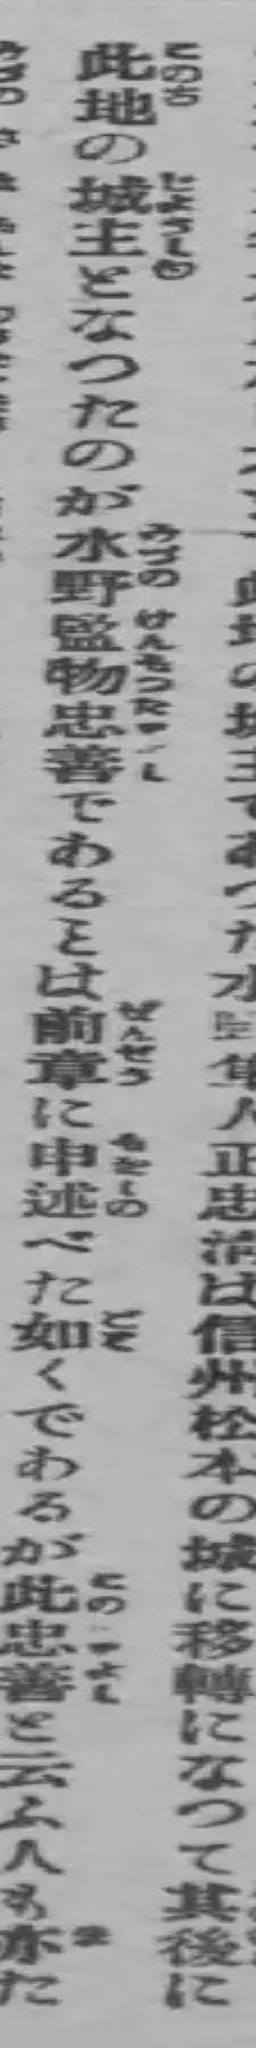此地の城主となつたのが水野監物忠善であることは前章に申述べた如くであるが此忠善と云ふ人も亦た
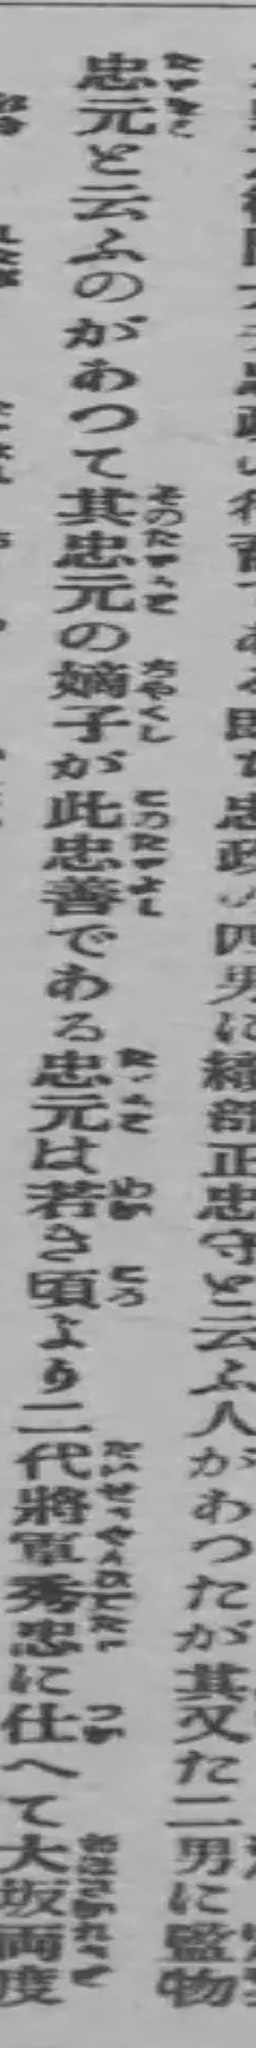水野忠元忠元と云ふのがあつて其忠元の嫡子が此忠善である忠元は若き頃より二代将軍秀忠に仕へて大坂両度
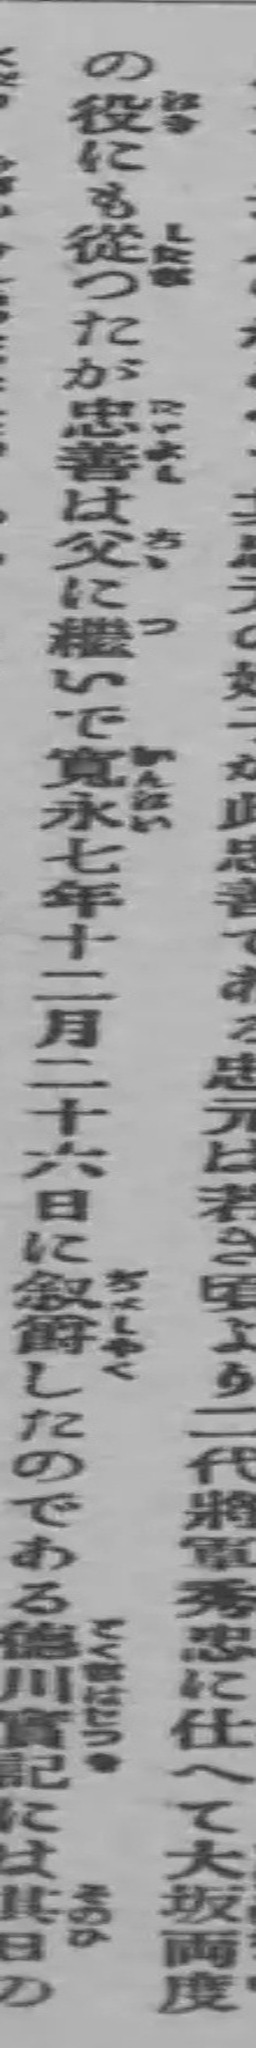の役にも従つたが忠善は父に継いで寛永七年十二月二十六日に叙爵したのである徳川実記には其日の
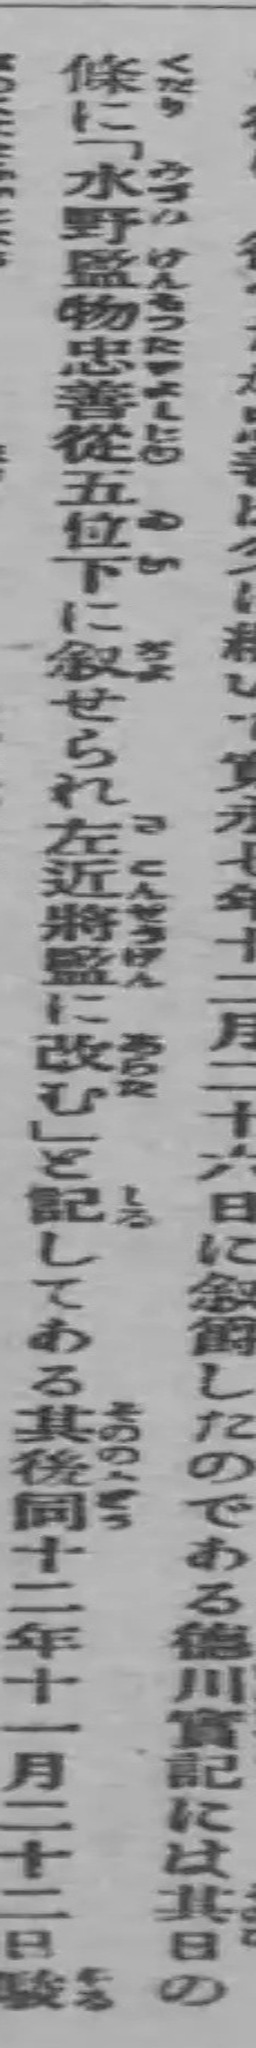条に「水野監物忠善従五位下に叙せられ左近将監に改む」と記してある其後同十二年十一月二十二日駿
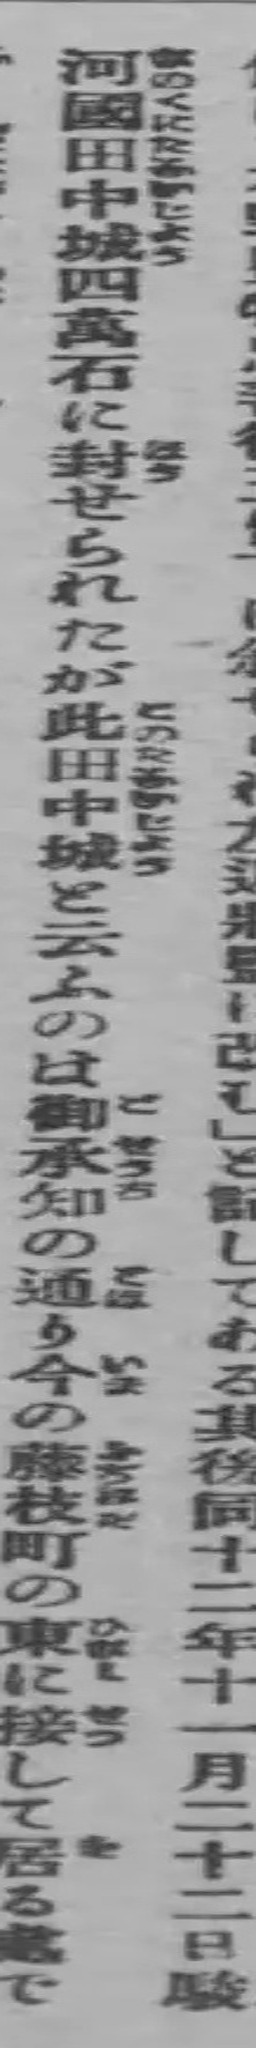河国田中城四万石に封せられたが此田中城と云ふのは御承知の通り今の藤枝町の東に接して居る処で
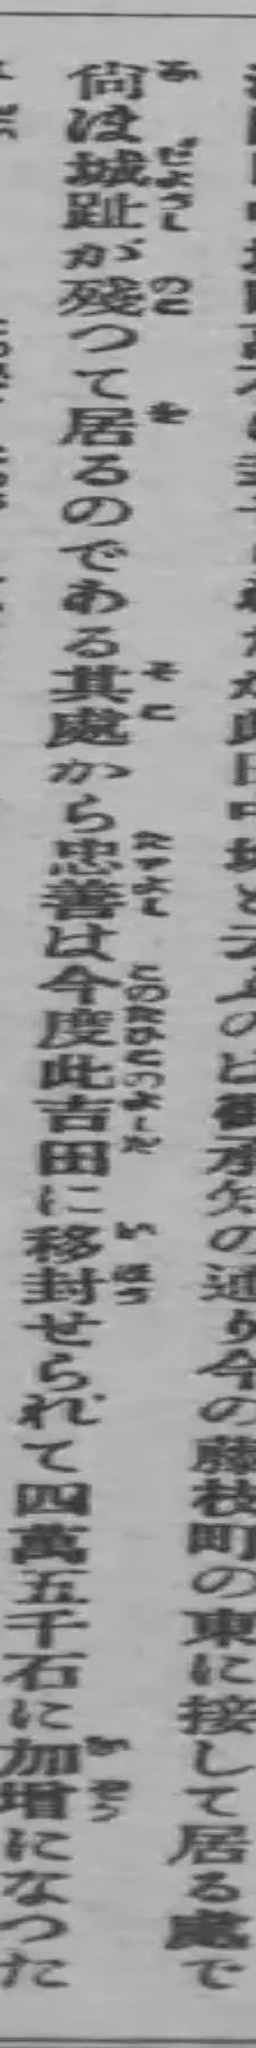尚ほ城趾が残つて居るのである其処から忠善は今度此吉田に移封せられて四万五千石に加増になつた
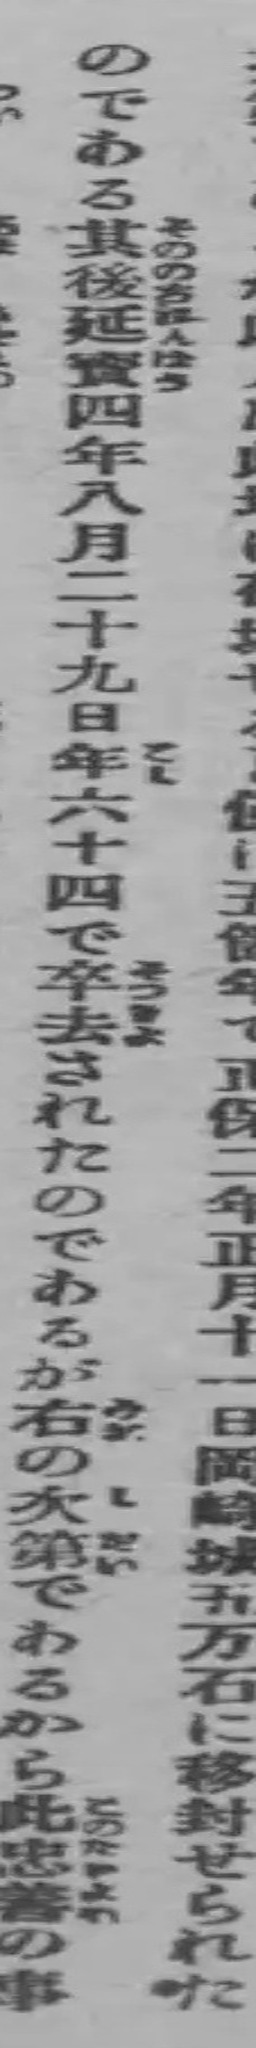のである其後延宝四年八月二十九日年六十四で卒去されたのであるが右の次第であるから此忠善の事
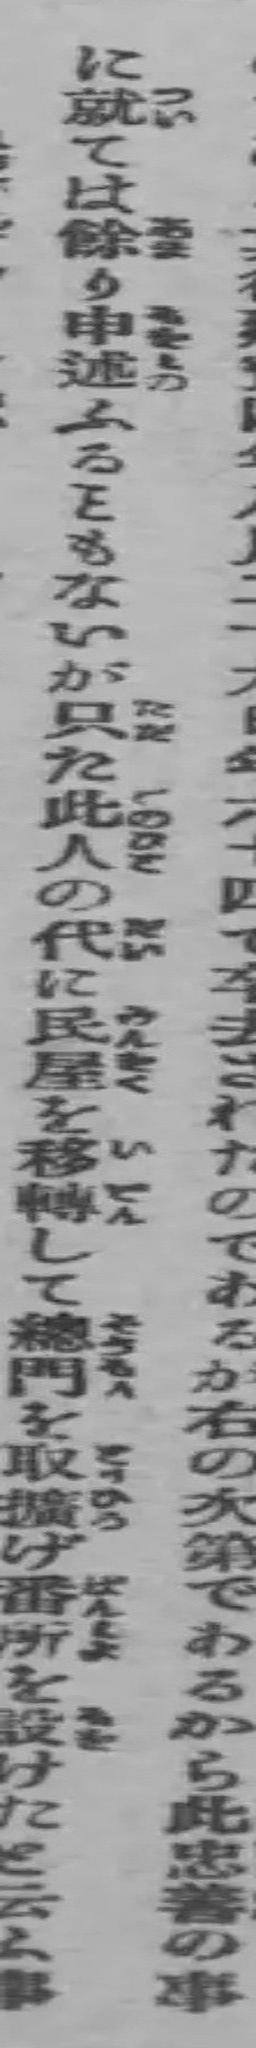に就ては余り申述ふることもないが只た此人の代に民屋を移転して総門を取拡げ番所を設けたと云ふ事
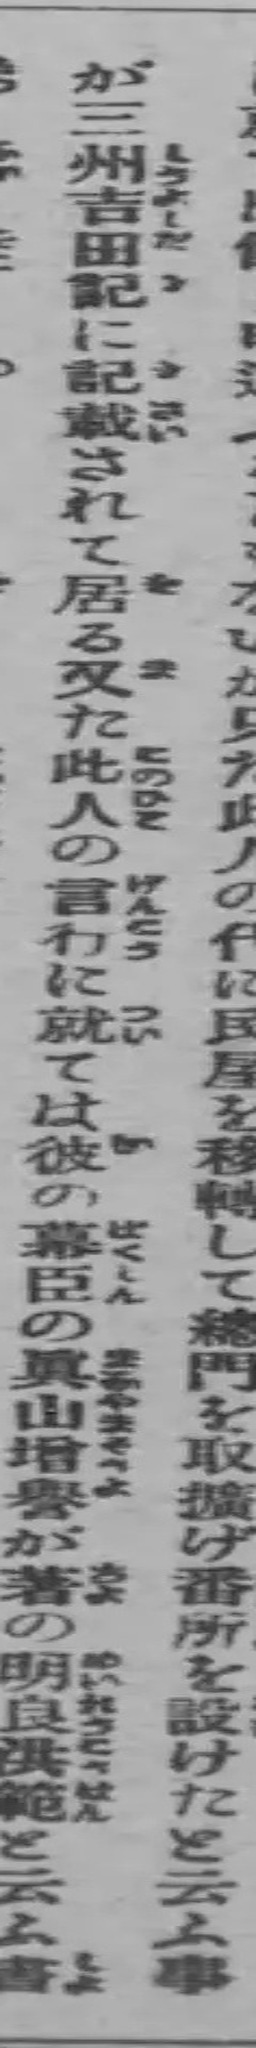忠善の言行が三州吉田記に記載されて居る又た此人の言行に就ては彼の幕臣の真山増誉が著の明良洪範と云ふ書
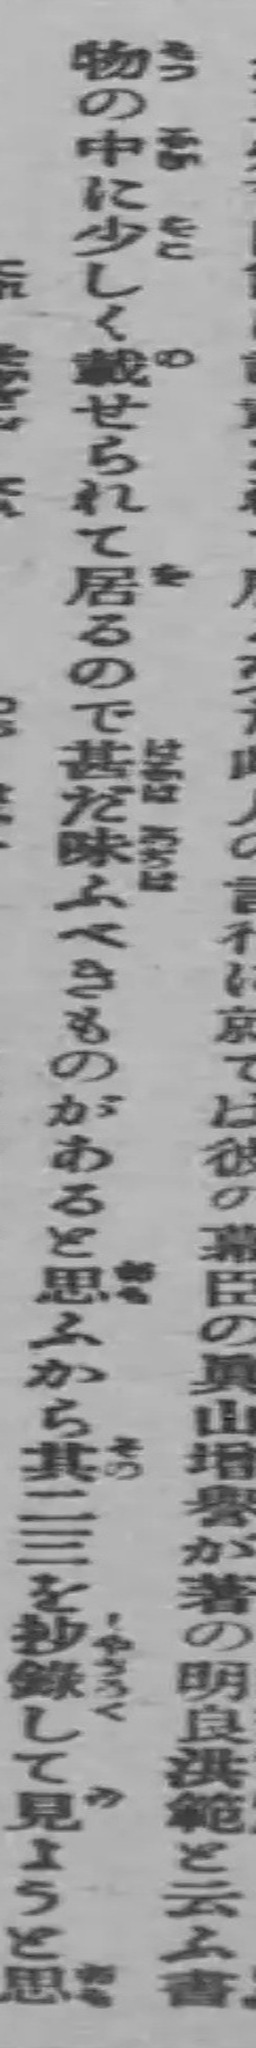物の中に少しく載せられて居るので甚だ味ふべきものがあると思ふから其二三を抄録して見ようと思
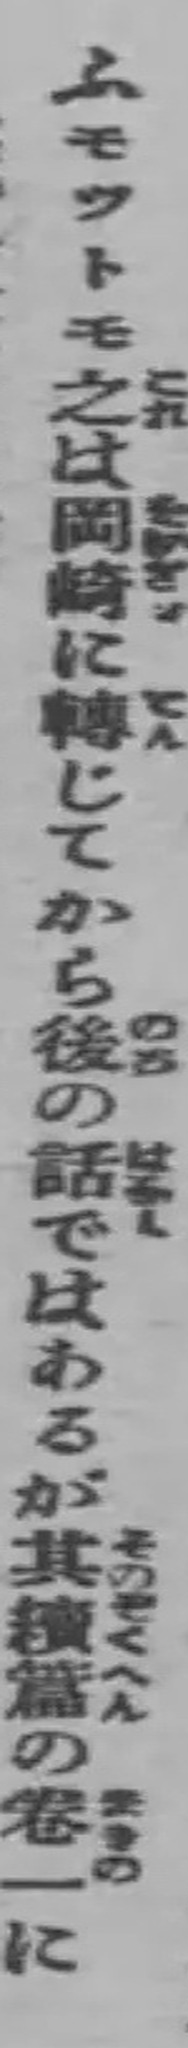ふモツトモ之は岡崎に転じてから後の話ではあるが其続篇の巻一に
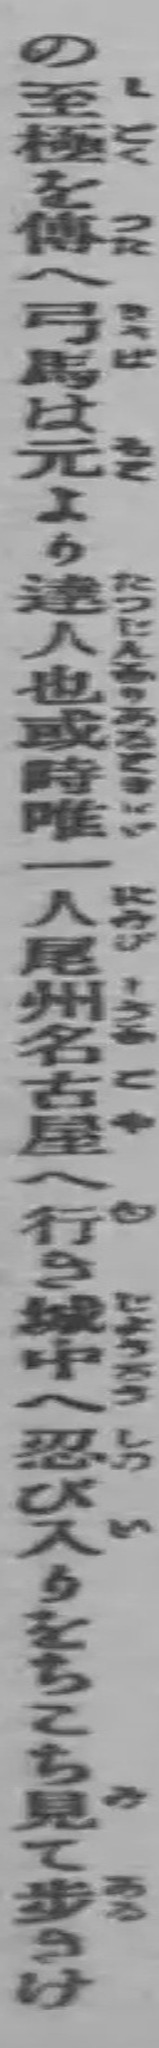の至極を伝へ弓馬は元より達人也或時唯一人尾州名古屋へ行き城中へ忍び入りをちこち見て歩きけ
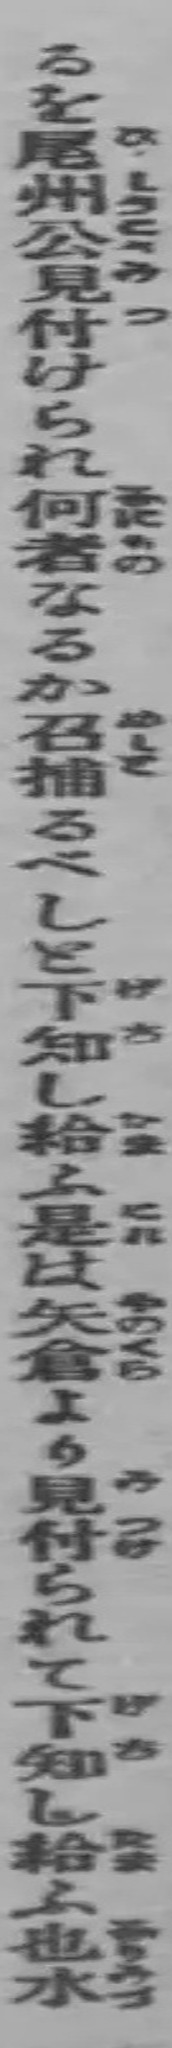るを尾州公見付けられ何者なるか召捕るべしと下知し給ふ是は矢倉より見付られて下知し給ふ也水
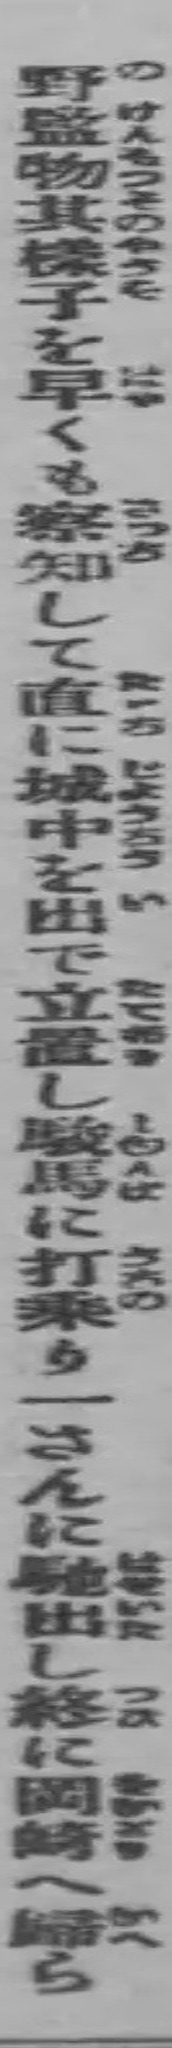野監物其様子を早くも察知して直に城中を出で立置し駿馬に打乗り一さんに馳出し終に岡崎へ帰ら
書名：豊橋市史談
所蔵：国立国会図書館 National Diet Library, JAPAN
